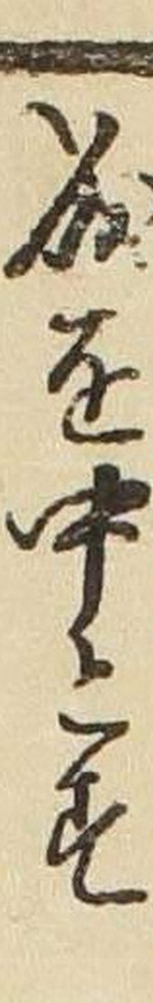成を中とす
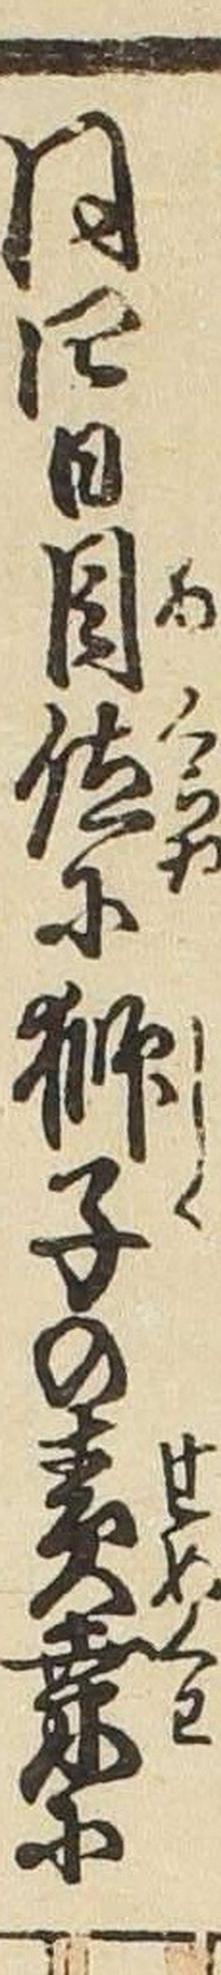同四日目位に獅子の責桑に
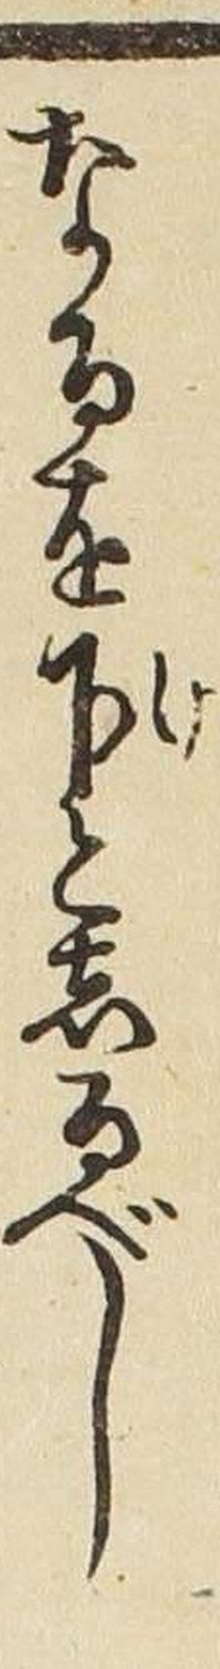なるを下としるべし
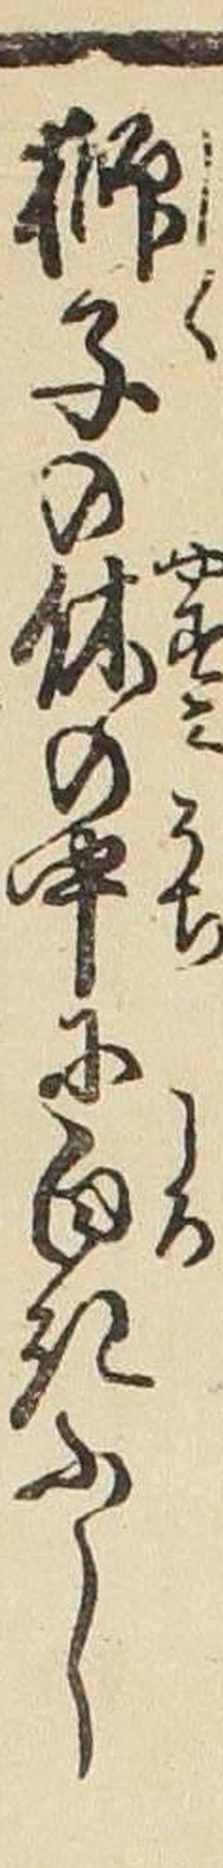獅子の休の中に白きふし
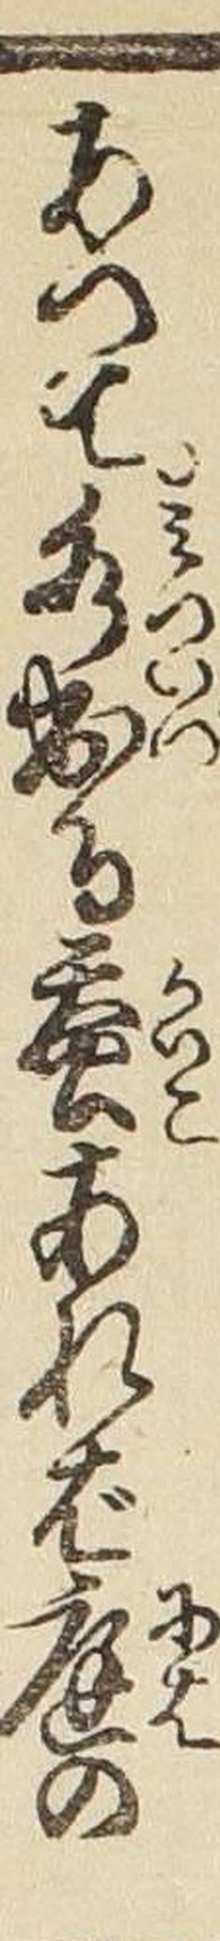あつて。水出る蚕あれば庭の
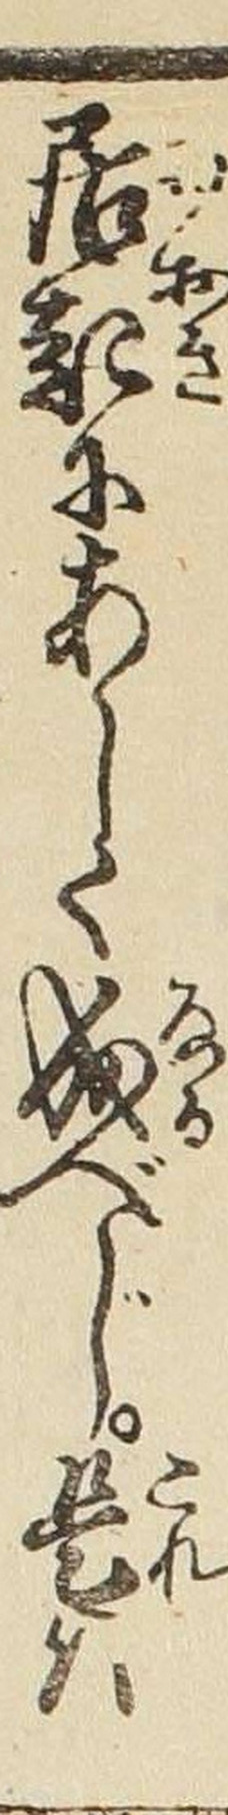居起にあしく成べじ。是は
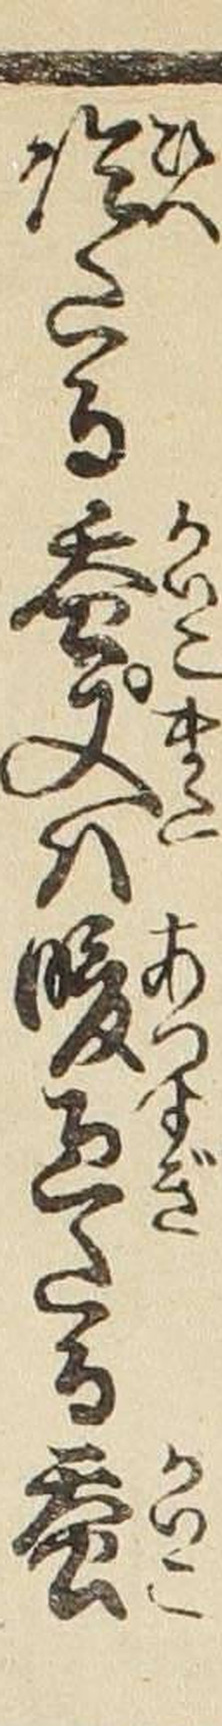冷たる蚕。又は暖過たる蚕
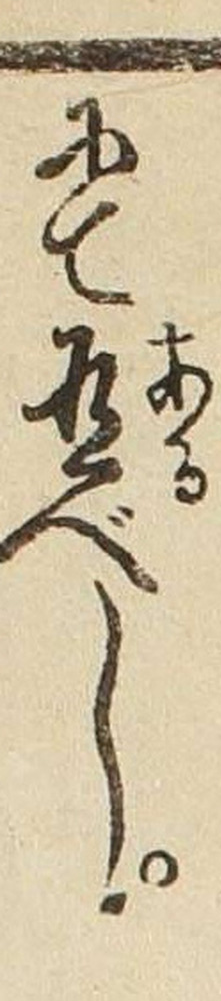にて有べし。
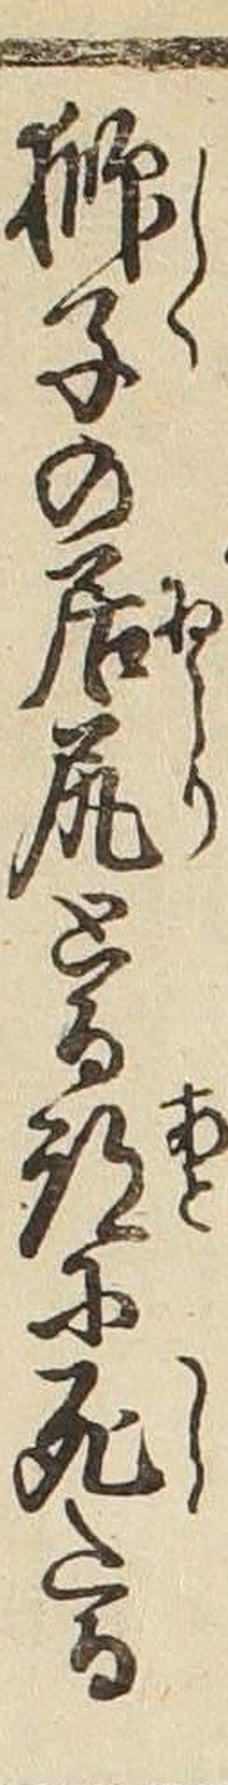獅子の居尻とる跡に死たる
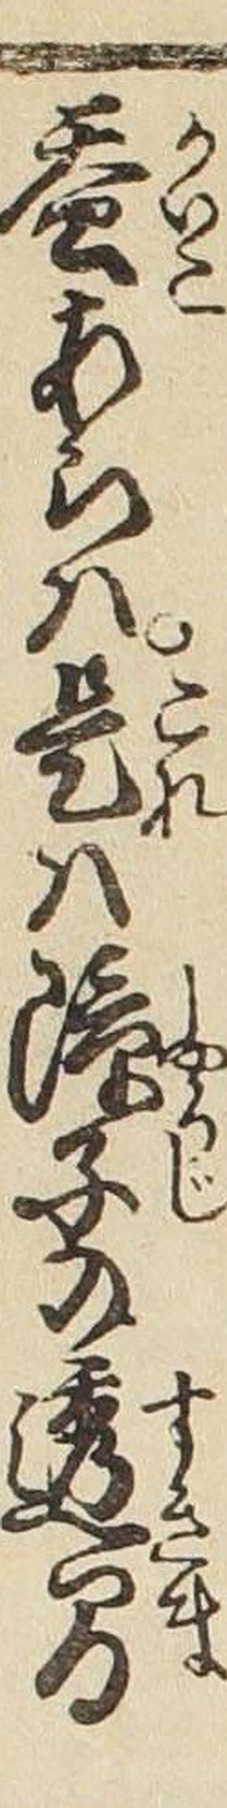蚕あらは。是は障子の透間
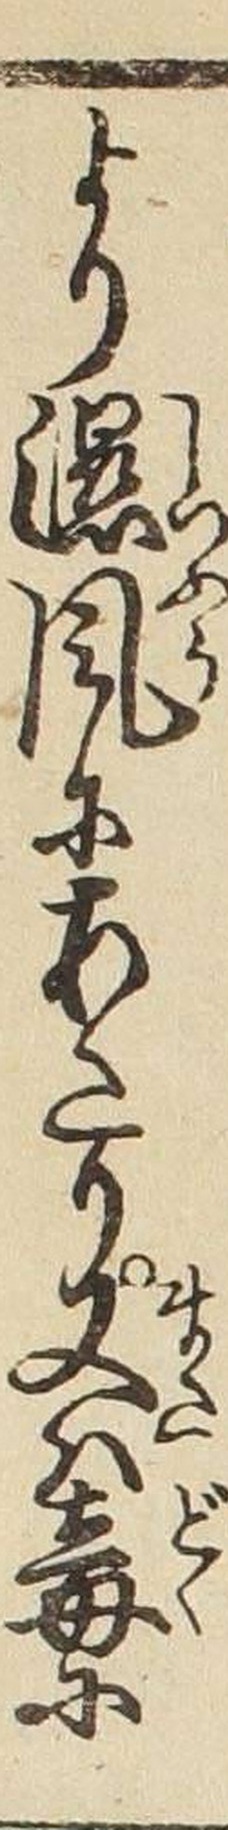より湿風にあたり。又は毒に
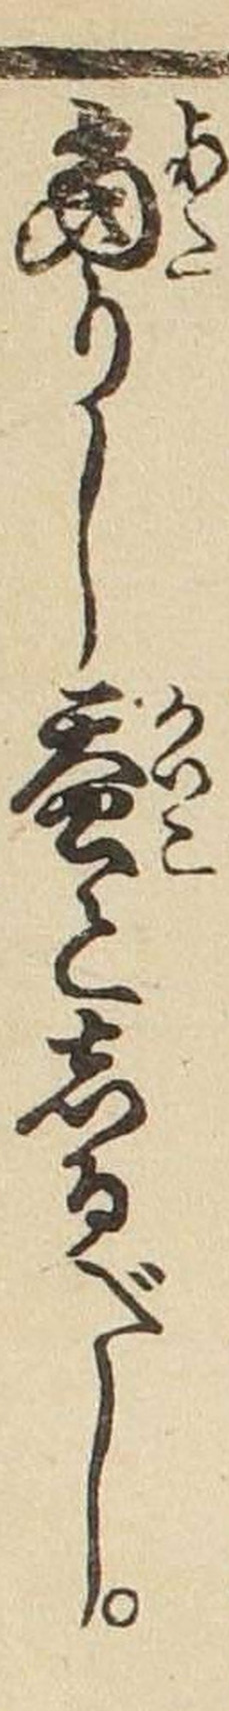当りし蚕としるべし。

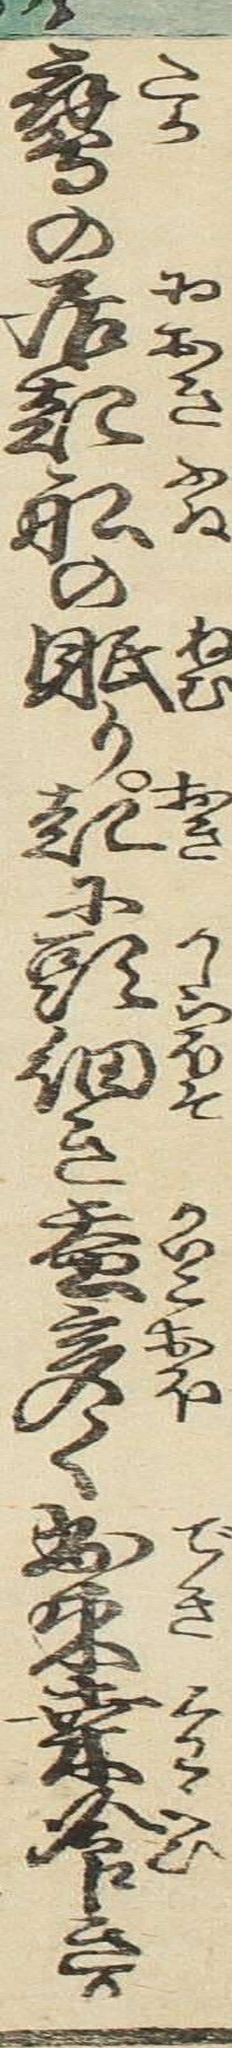鷹の居起船の眠り。起に頭細き蚕多く出来桑喰き
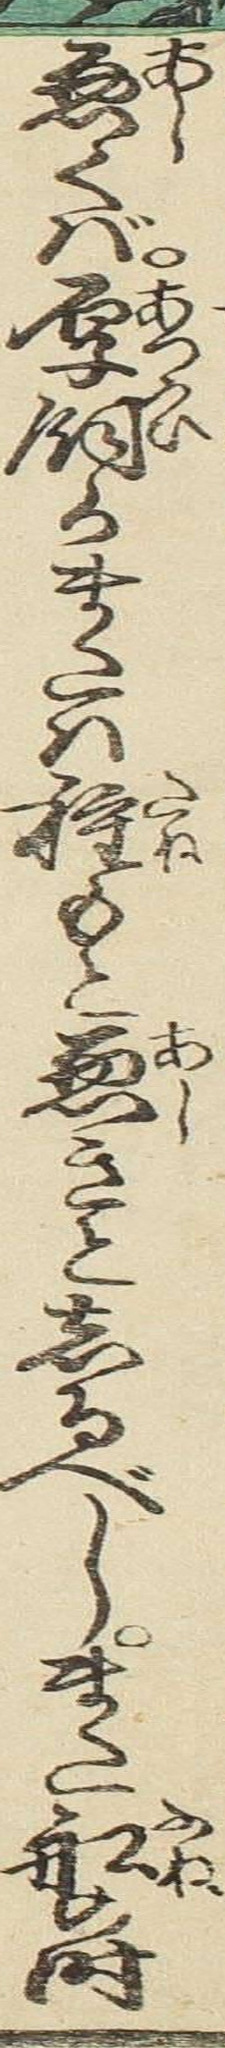悪くば。厚飼かまたは種もと悪きとしるべし。また船の時
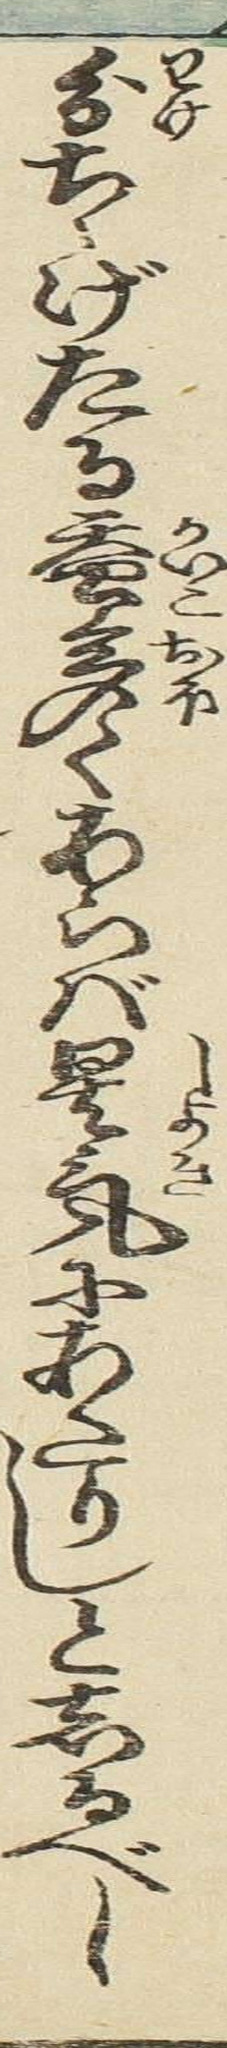分ちゝげたる蚕多くあらば暑気にあたりしとしるべし
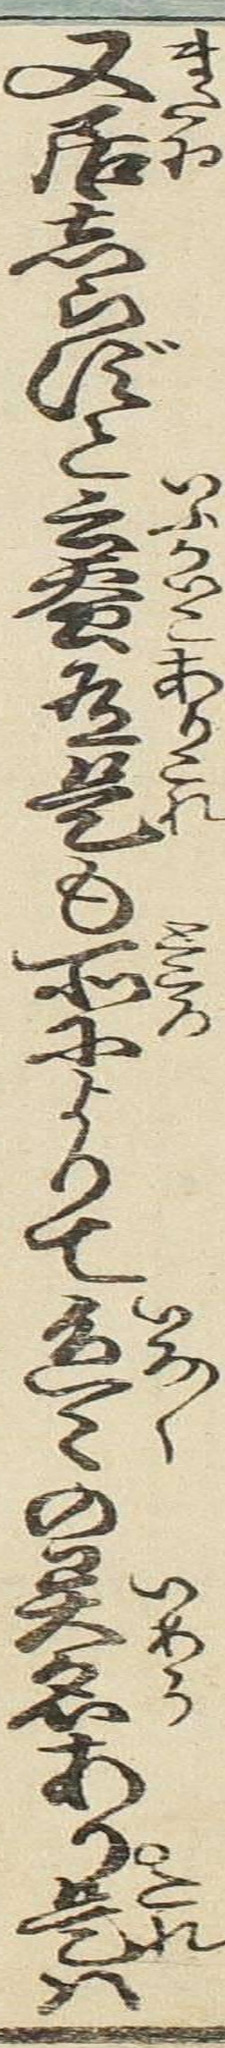又居しらずと言蚕有是も所によりて色々の異名あり。是は
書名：養蠶圖解
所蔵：東京大学農学生命科学図書館 国文学研究資料館
